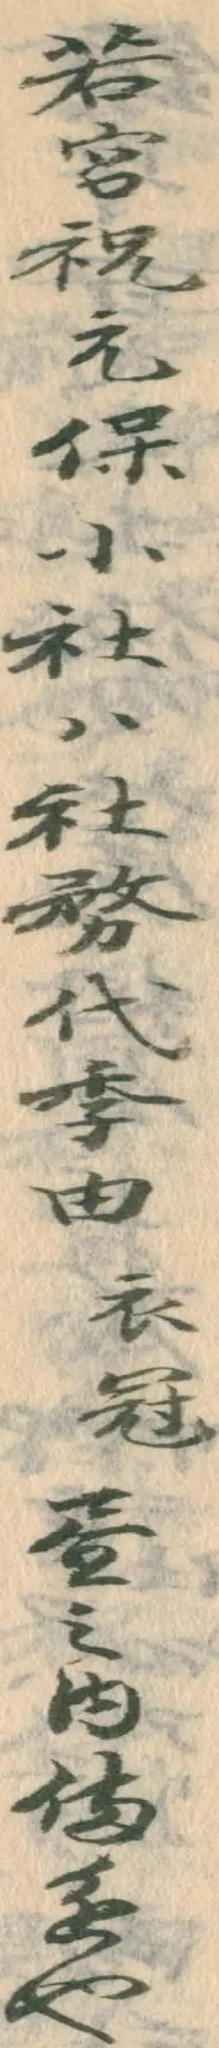若宮祝元保小社ハ社務代季由衣冠昼之内備進也
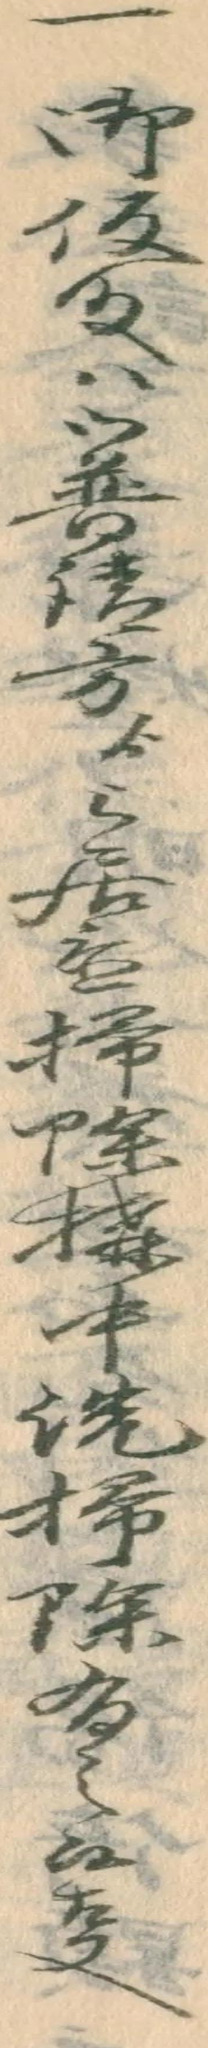一御仮殿ハ御普請方ゟ被居置掃除構中洗掃除有之候事
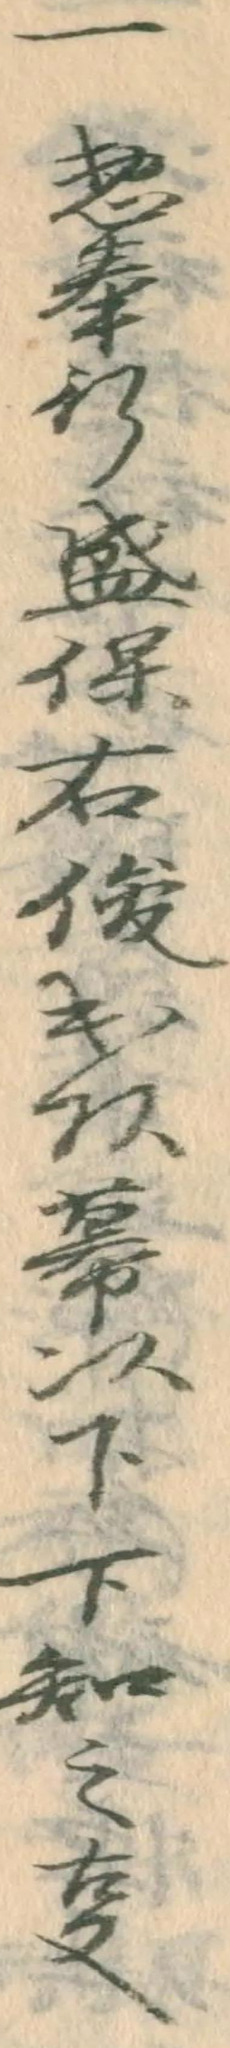一惣奉行盛保右俊出頭幕以下下知之事
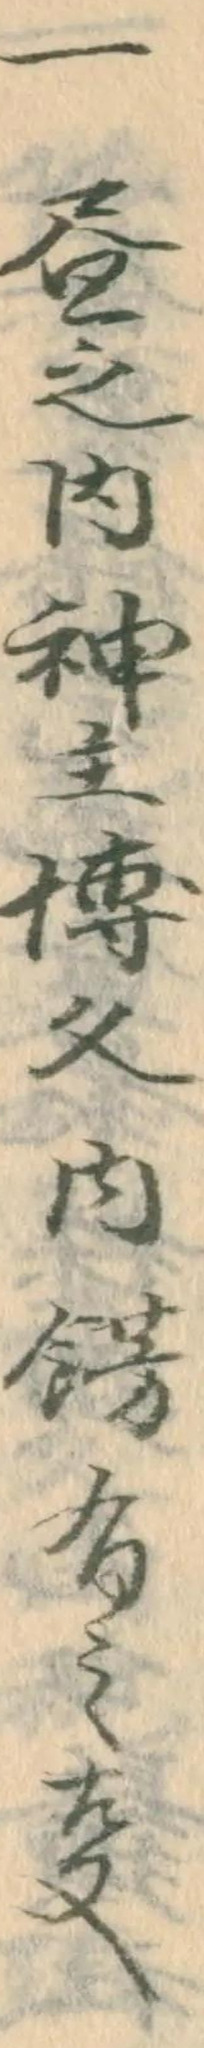一昼之内神主博久内飾有之事

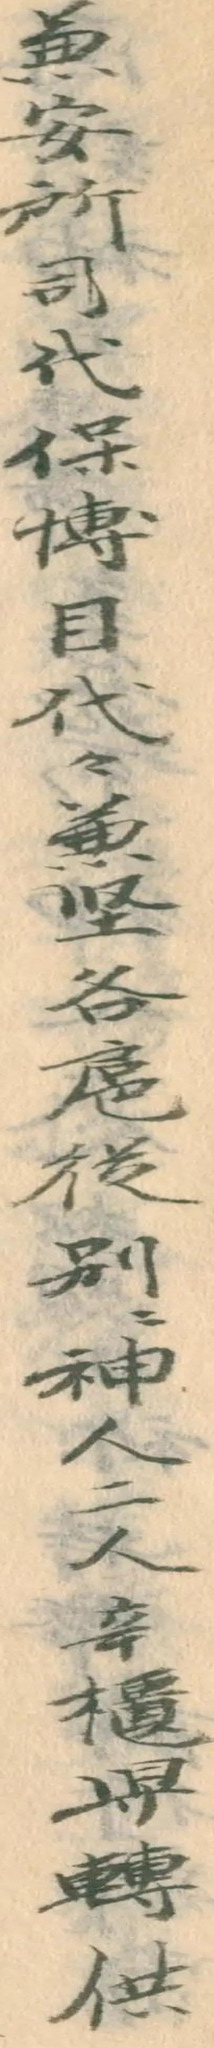兼安所司代保博目代々兼堅各扈従別ニ神人二人辛櫃舁転供
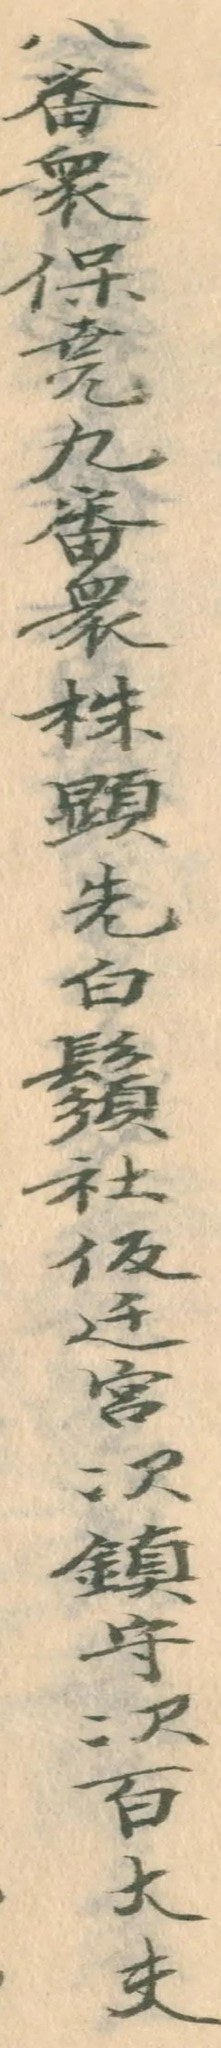八番衆保堯九番衆株顕先白鬚社仮迁宮次鎮守次百大夫
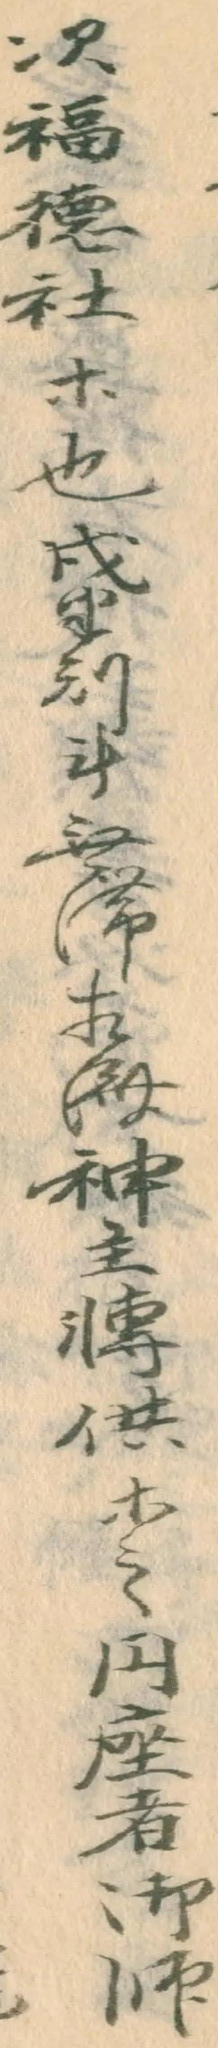次福徳社等也戌半刻計無滞相済神主転供等之円座者御師
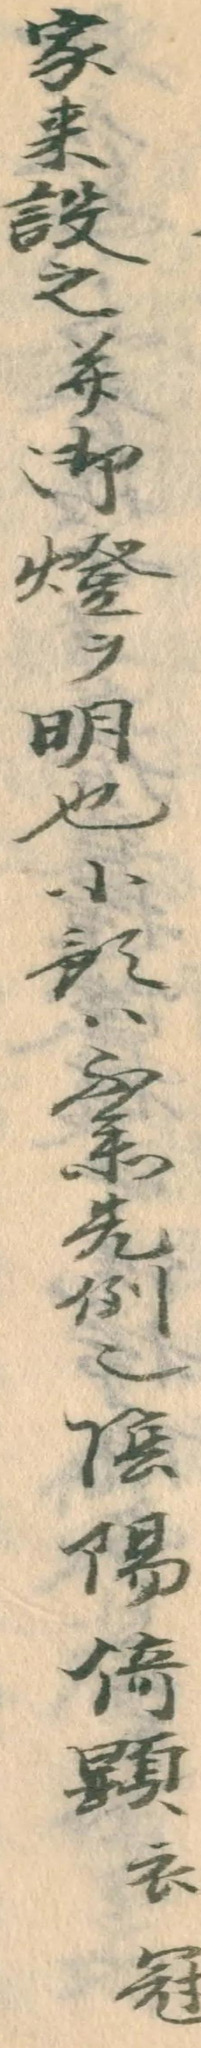家来設之并御燈ヲ明也小預ハ不参先例也陰陽倚顕衣冠
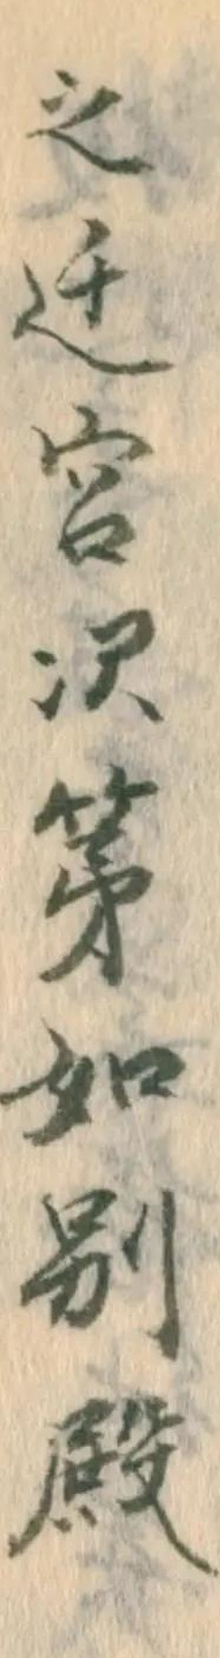之迁宮次第如別殿
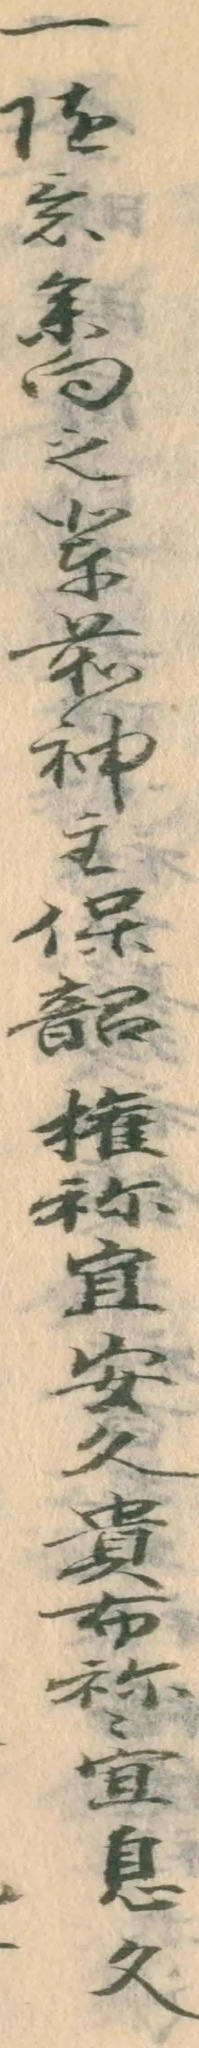一随意参向之輩前神主保韶権祢宜安久貴布祢々宜息久
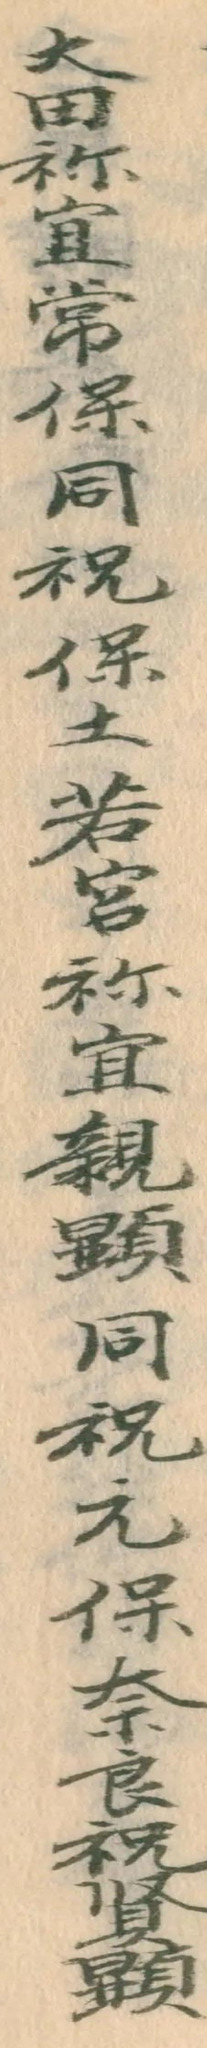大田祢宜常保同祝保土若宮祢宜親顕同祝元保奈良祝賢顕
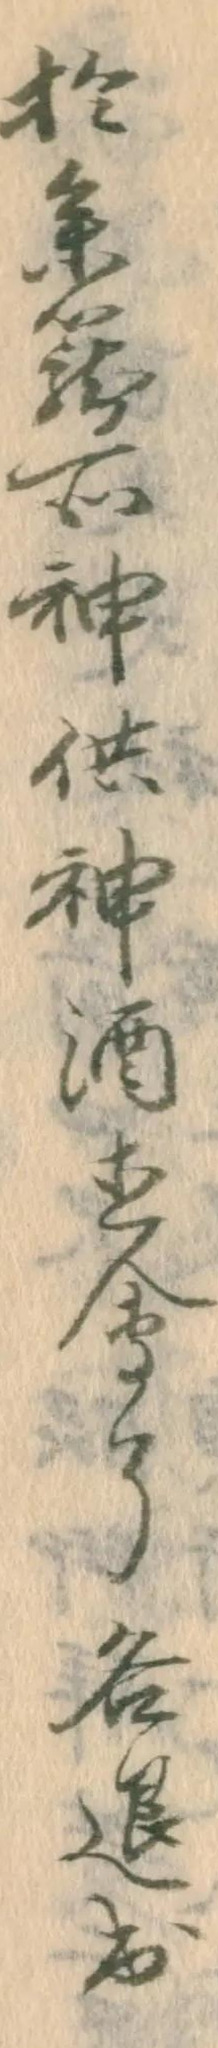於参籠所神供神酒直会了各退出
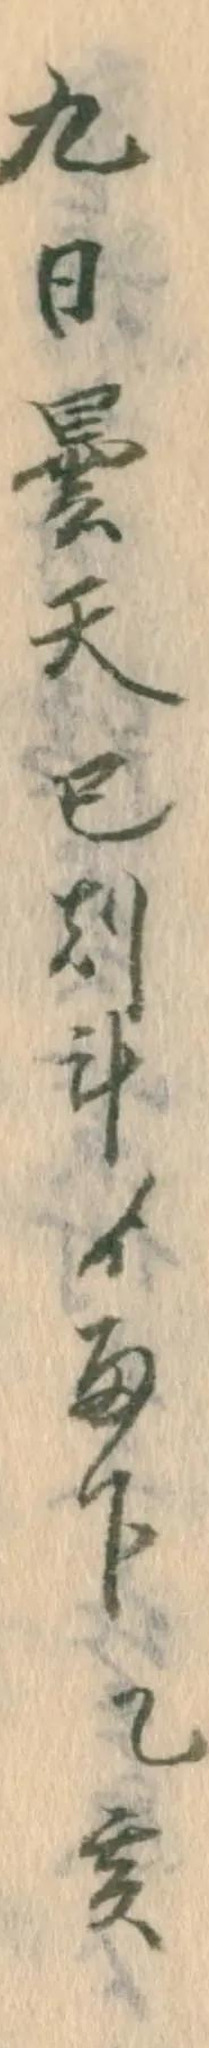九日曇天巳刻計ゟ雨下乙亥
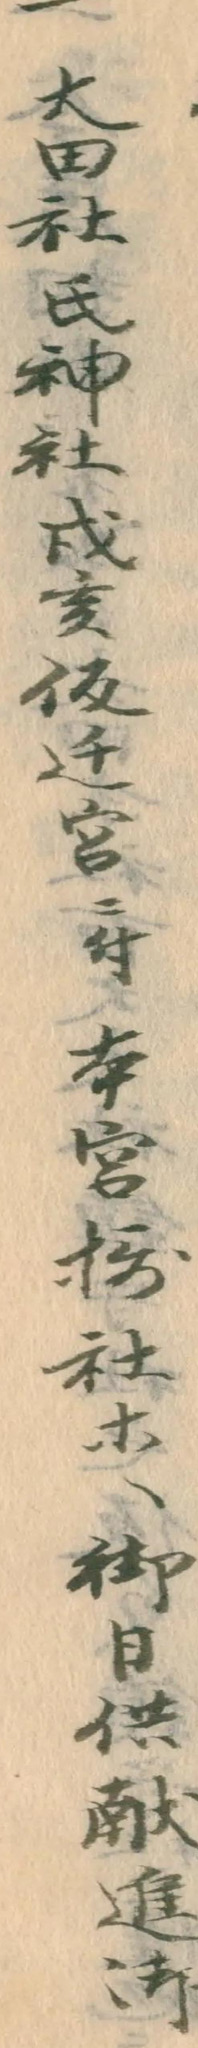一大田社氏神社戌亥仮迁宮ニ付本宮摂社等ヘ御日供献進御
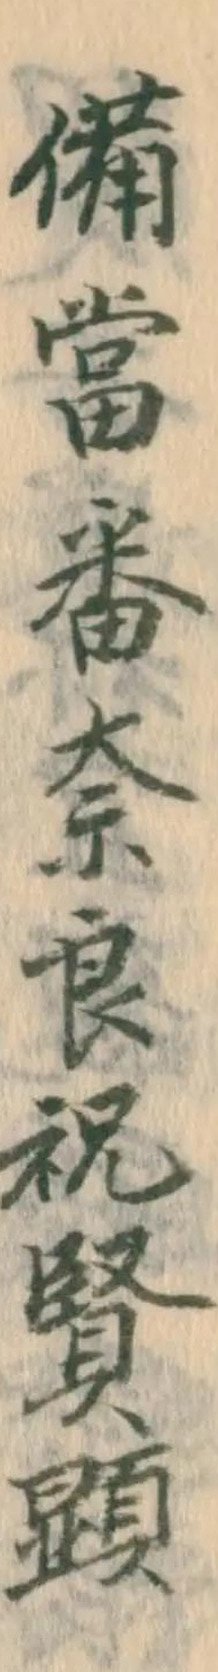備当番奈良祝賢顕
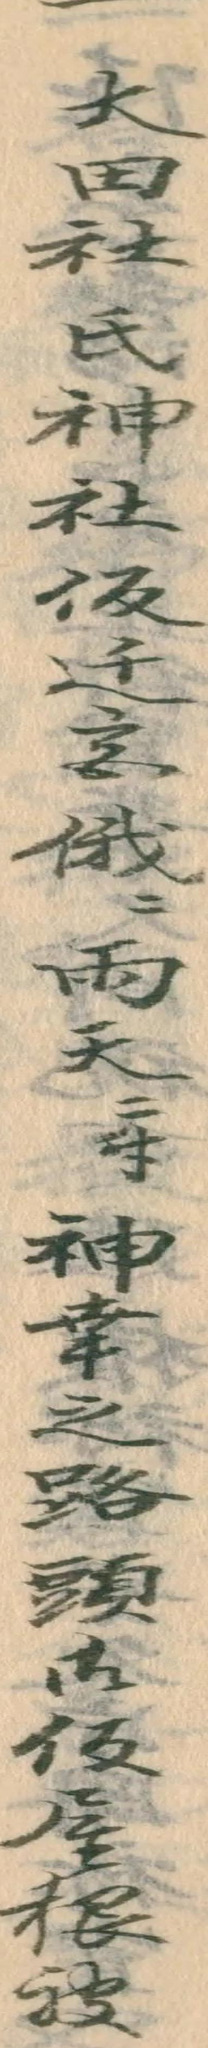一大田社氏神社仮迁宮俄ニ両天ニ付神幸之路頭御仮屋根被
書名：賀茂社記録. 第17冊
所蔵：国立国会図書館 National Diet Library, JAPAN
